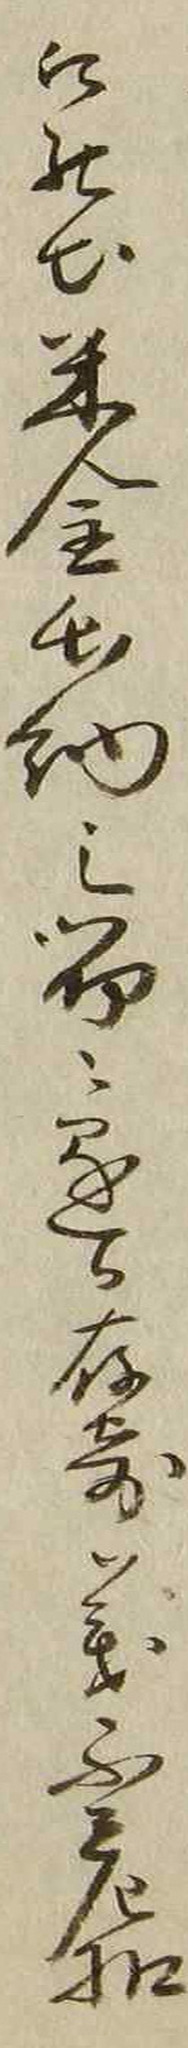江罷出米金出納之筋ニ懸り存寄候義不差扣
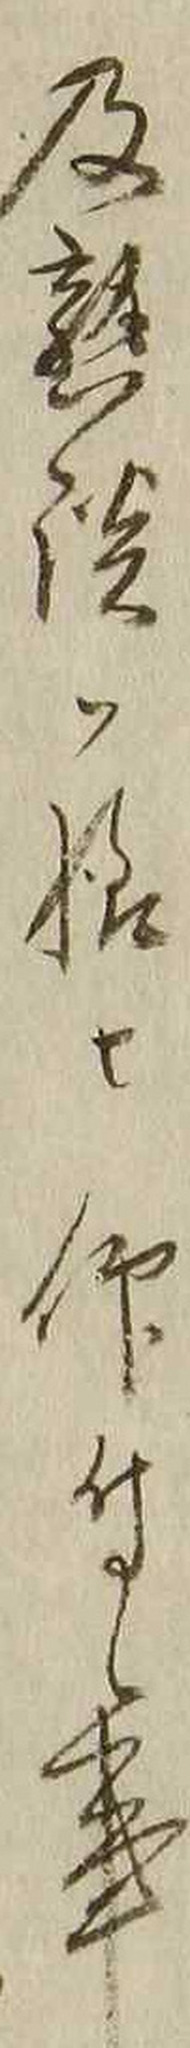及熟談候様被仰付候事
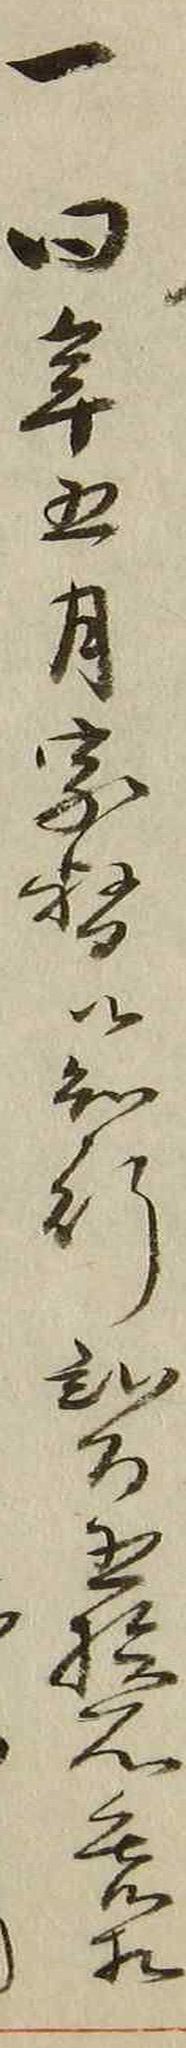一同年五月家督御知行弐百五拾石無御相
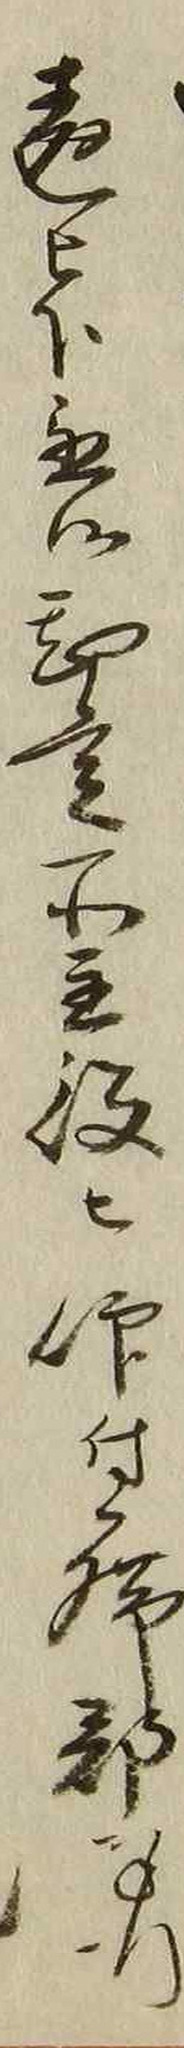違被下置御勘定所主役被仰付席郡奉行
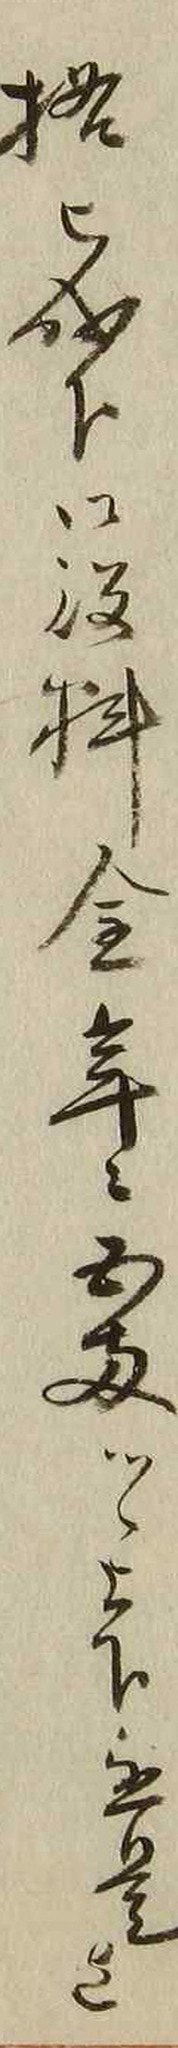格被成下御役料金年々五両ツヽ被下置是迄
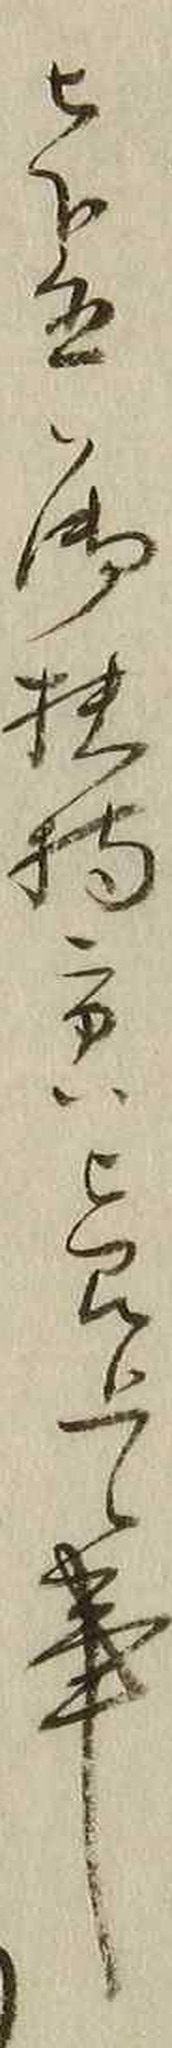被下置候御扶持方ハ被召上候事
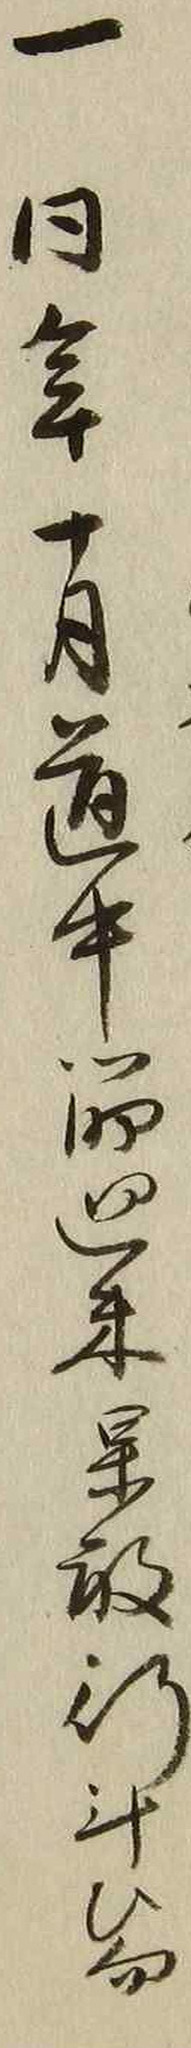一同年十月道中筋廻米果敢行計ひ勿
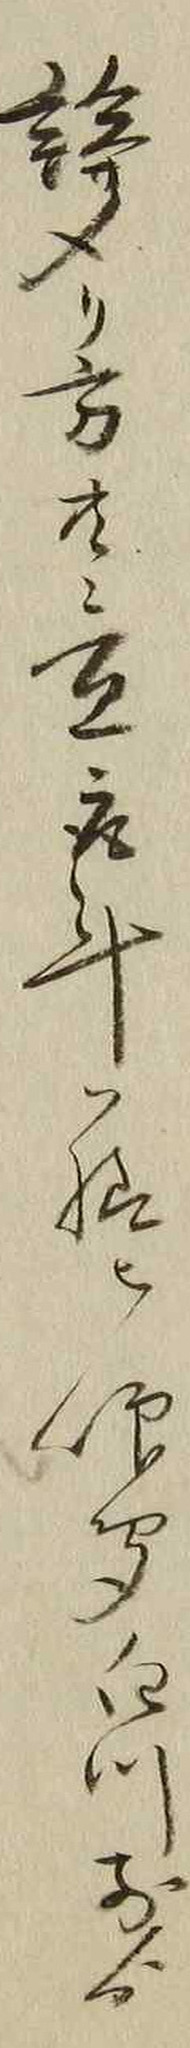論〆り方共ニ宜取計候様被仰聞白川前ゟ
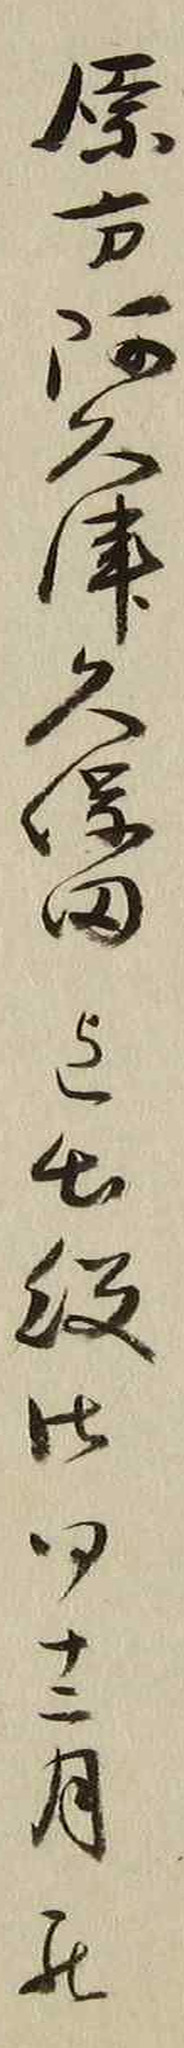原方阿久津久保田迄出役仕同十二月罷
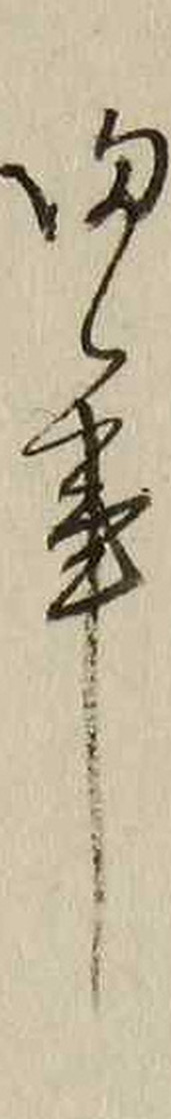帰候事
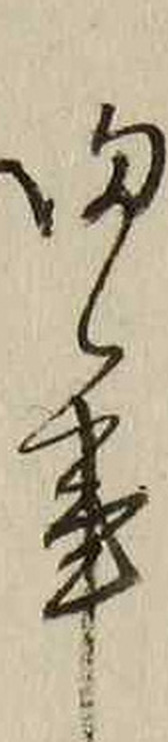帰候事
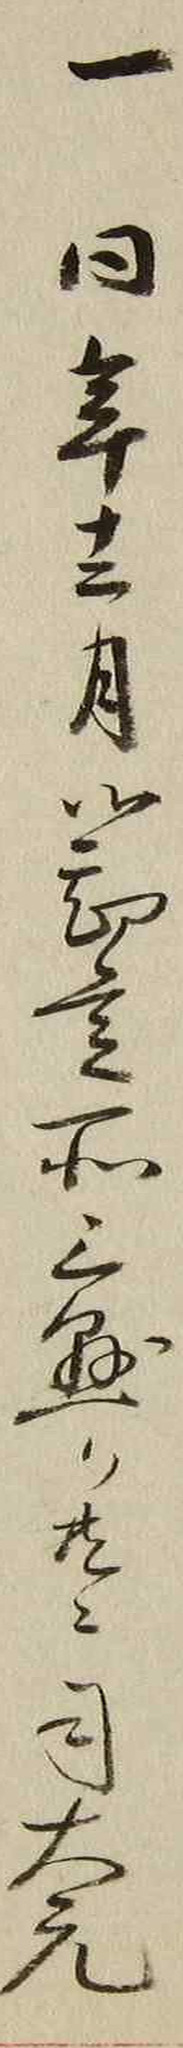一同年十二月御勘定所三懸り共ニ司大元
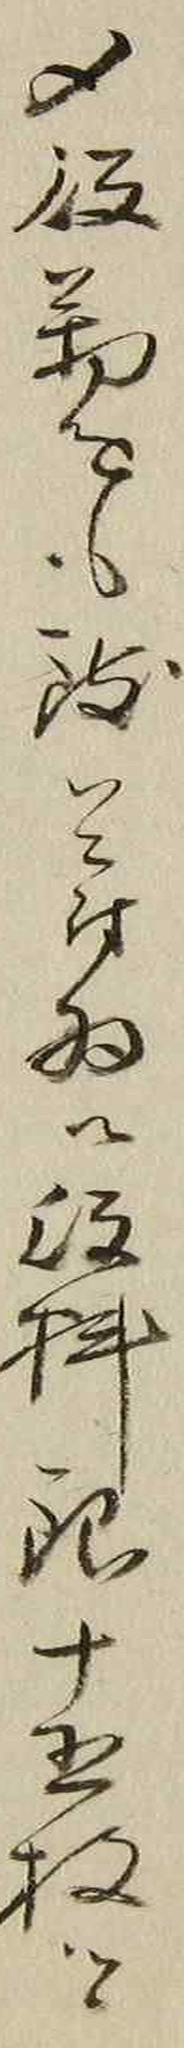〆役勤をも致候ニ付為御役料銀十五枚ツヽ
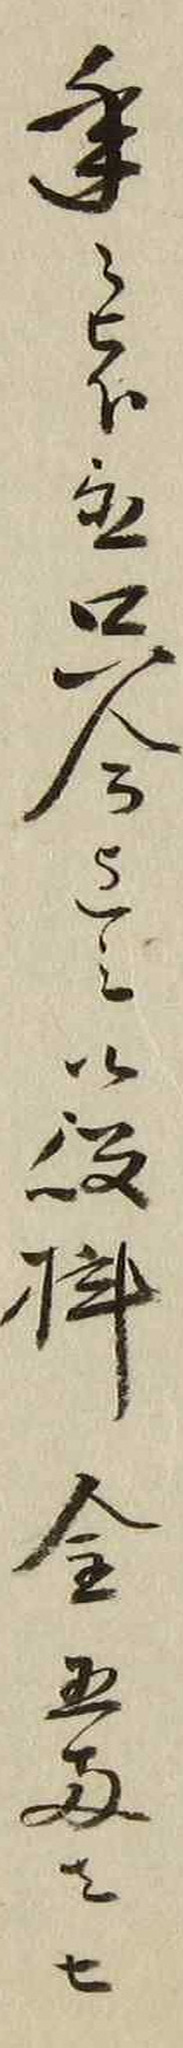年々被下置只今迄之御役料金五両者被
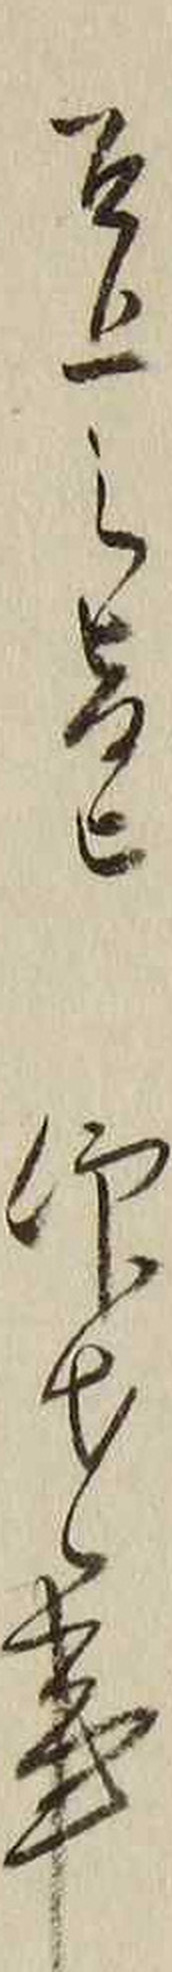召上之旨被仰出候事
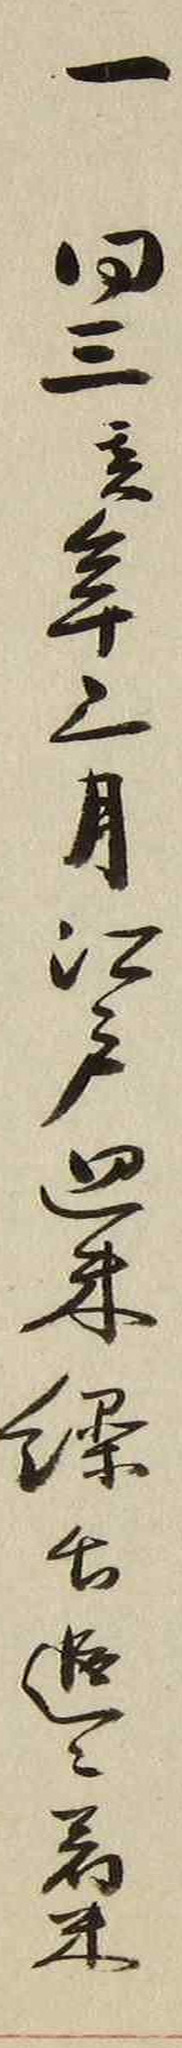一同三亥年三月江戸廻米繰出追々着米
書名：諸士系譜　巻之311　し之部1
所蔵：会津若松市立会津図書館
